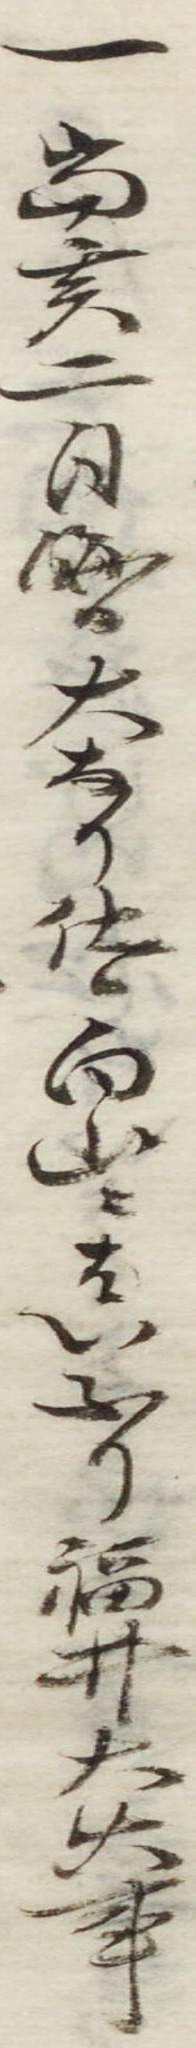一当亥二月晦日大なり仕候白山にはいふり福井大火事
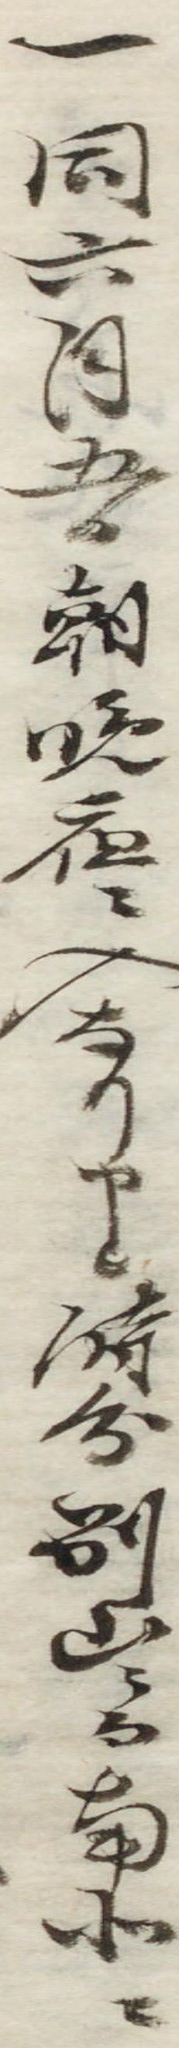一同六月五日朝晩夜に入なり申候時分別山に而南北に
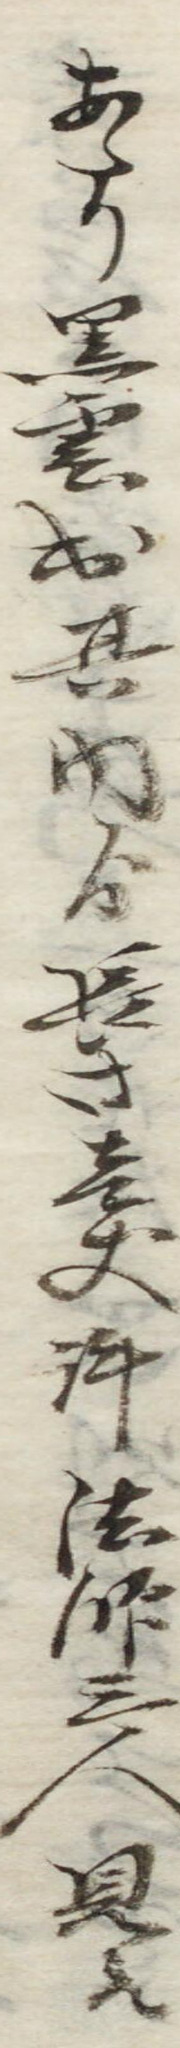あたり黒雲出其内ゟ長き壱丈許法師三人見え
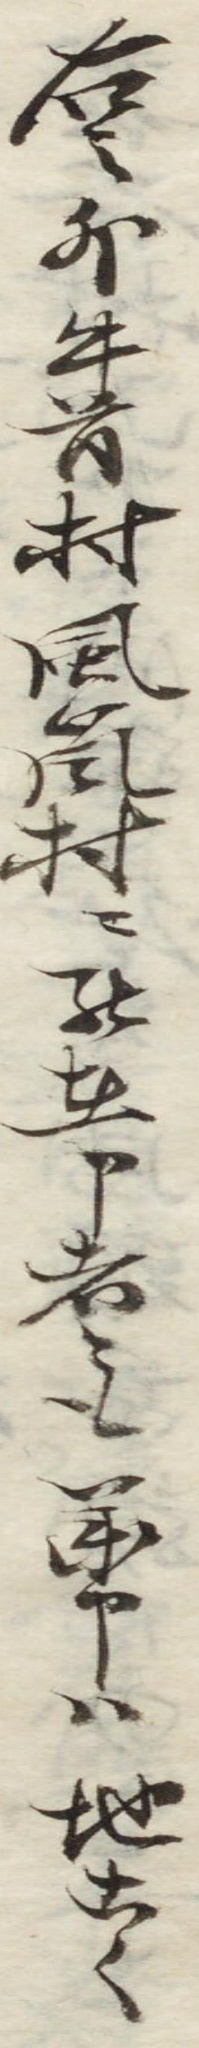右之外牛首村風嵐村に罷在申者とも承申は地こく
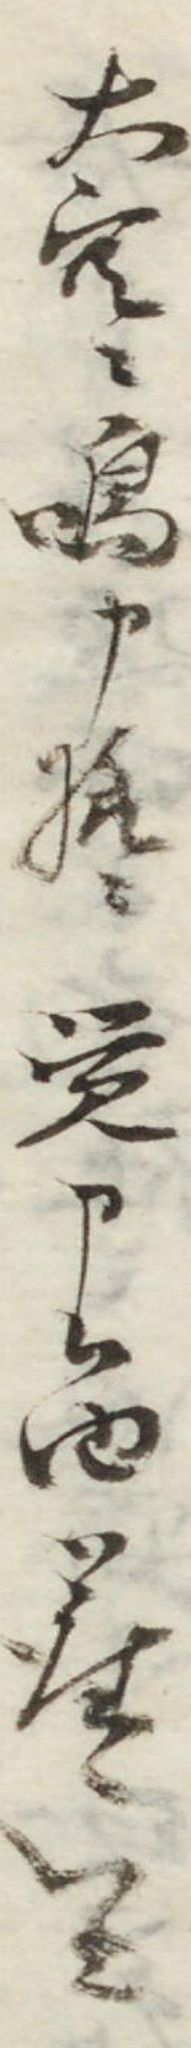大穴に鳴申様に覚申候由御座候以上
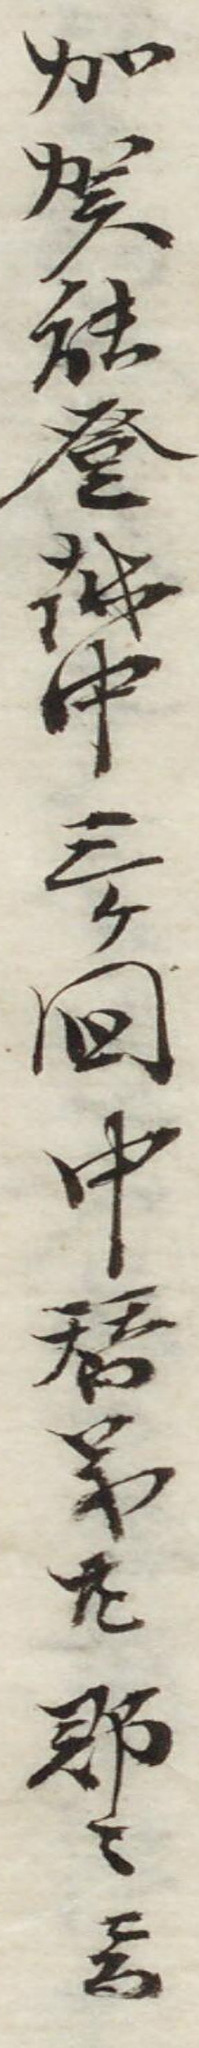加賀能登越中三ヶ国中替義共郡々に而
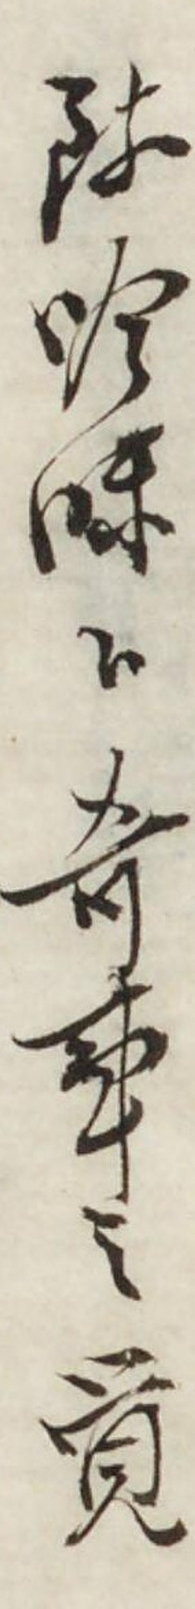被吟味候奇事之覚
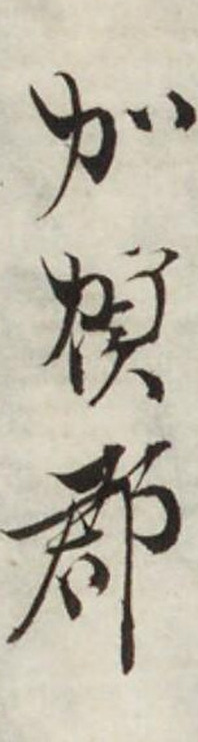加賀郡
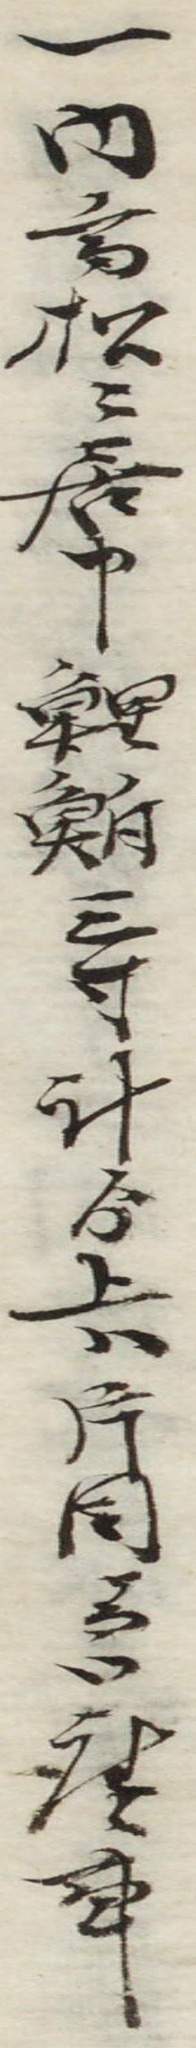一内高松におり居申鯉鮒三寸計ゟ上は片目に而御座候事
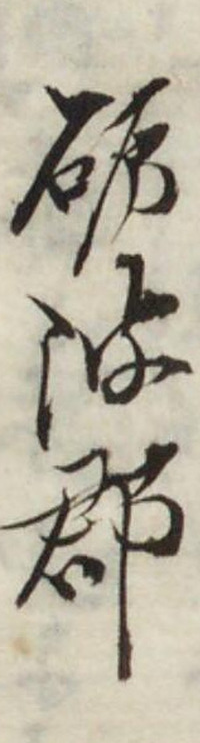砺波郡

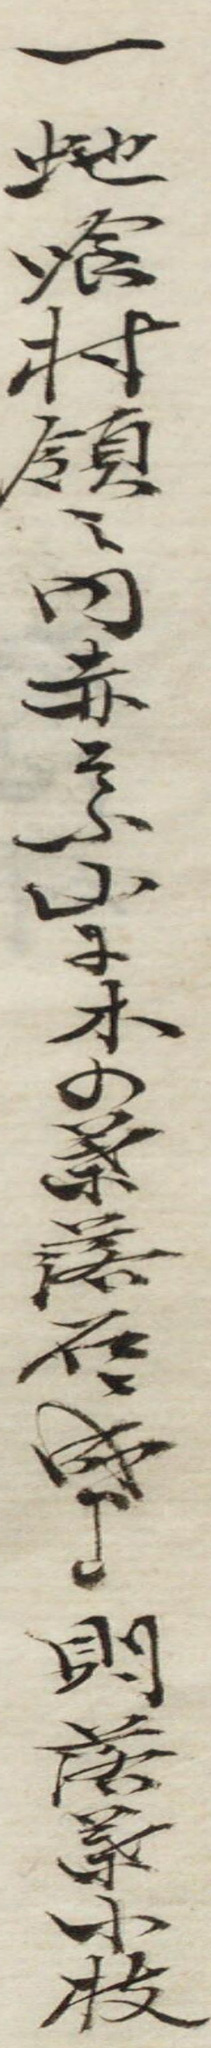一地喰村領之内赤そふ山に木の葉落石と成申候則落葉小枝
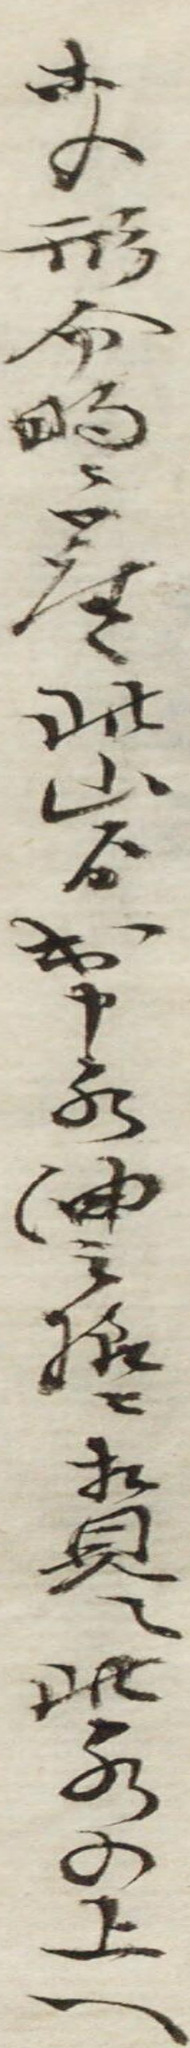等の形分明に御座候此山ゟ出申水油之様に相見え此水の上へ
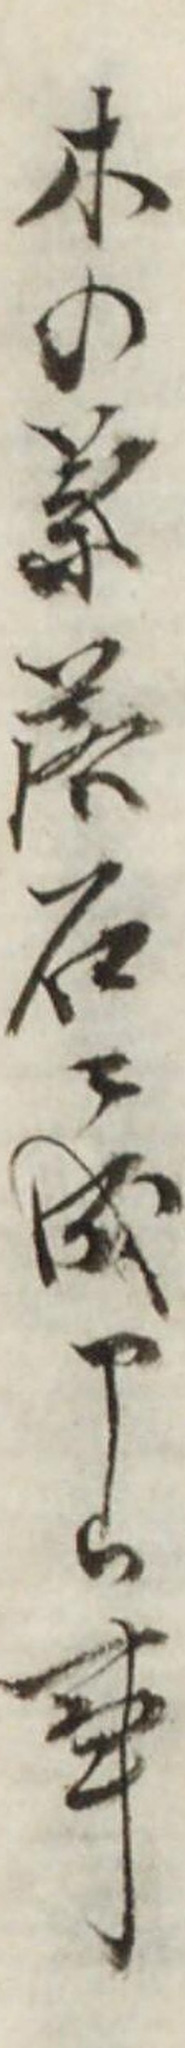木の葉落石に成申候事
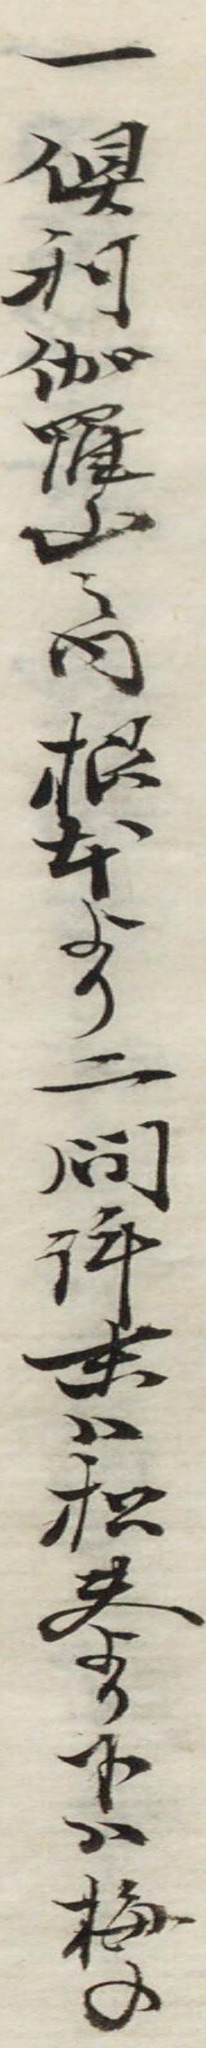一倶利伽羅山之内根本より二間許末は松夫より下は梅の
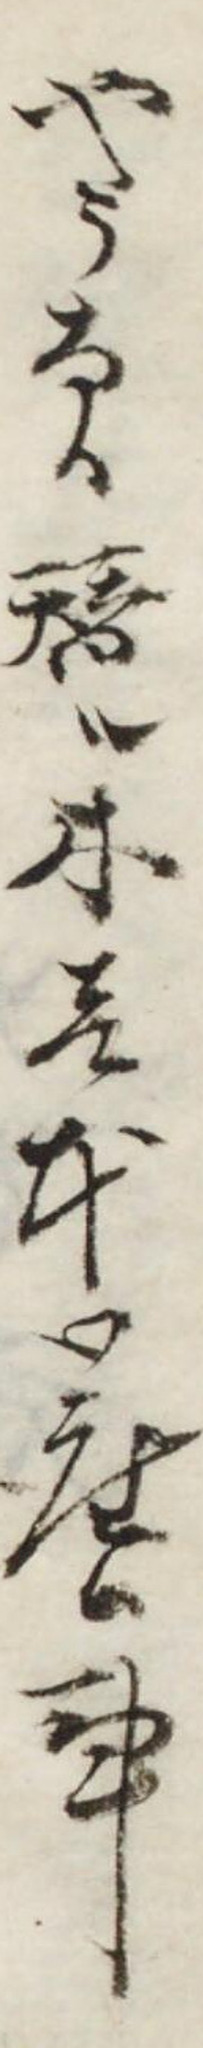やうなる替る木壱本御座候事
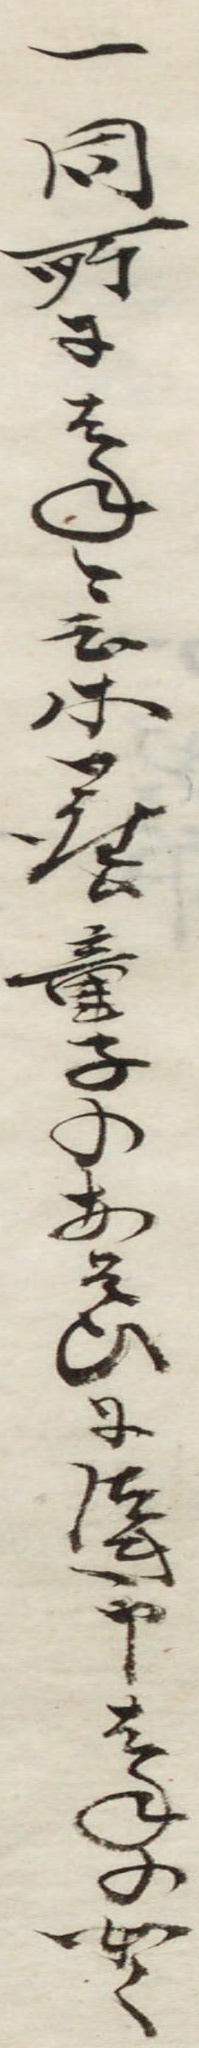一同所にはねと云木御座候童子のあそひにつき申はねの如く
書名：古老旧聞紀略
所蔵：Ishikawa Prefectural Library
